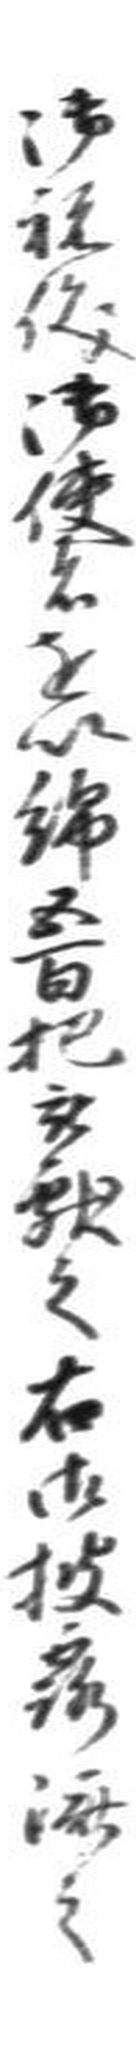御祝儀御使者を以綿五百把被献之右御披露済之
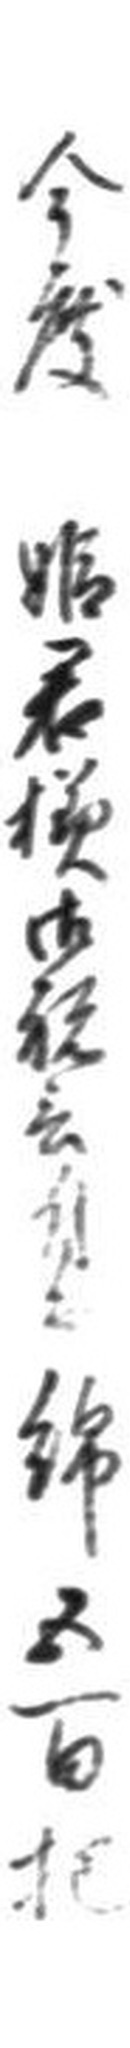今度姫君様御祝言ニ付而綿五百把

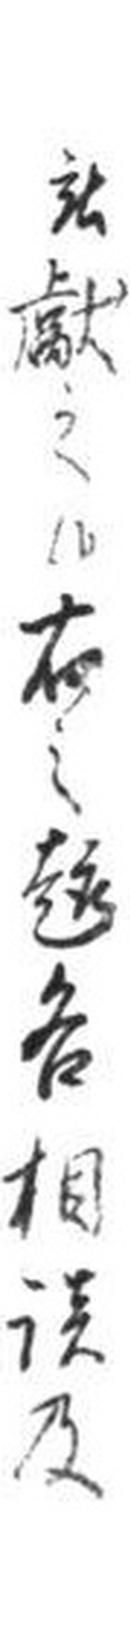被献之右之趣各相談及
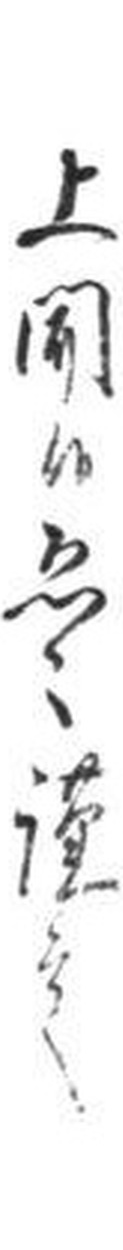上聞候恐々謹言
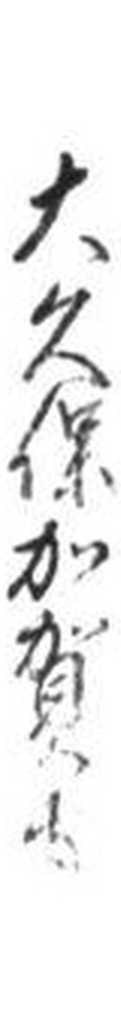大久保加賀守
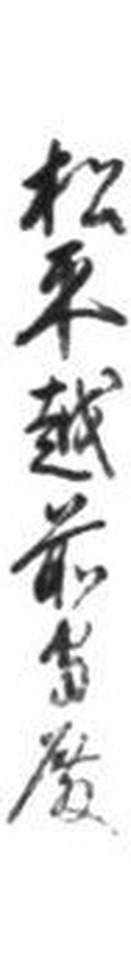松平越前守殿
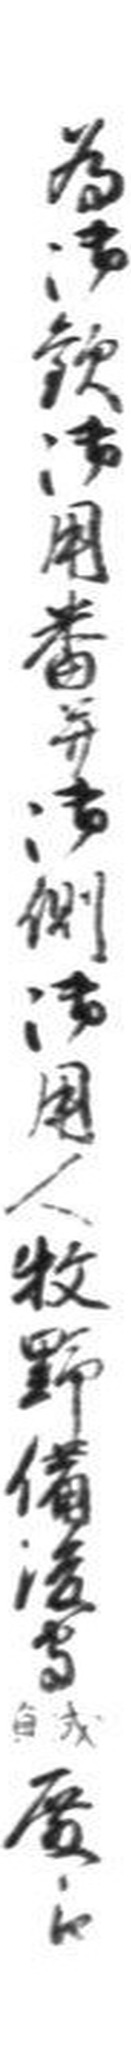為御歓御用番并御側御用人牧野備後守成貞殿江
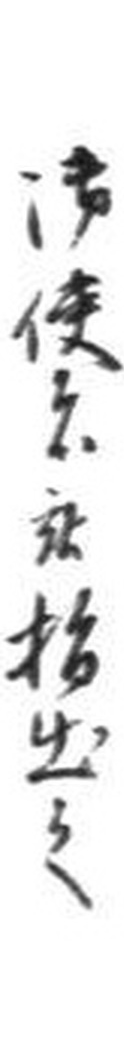御使者被指出之
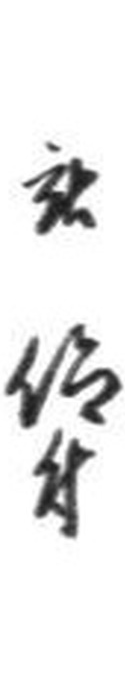被仰付
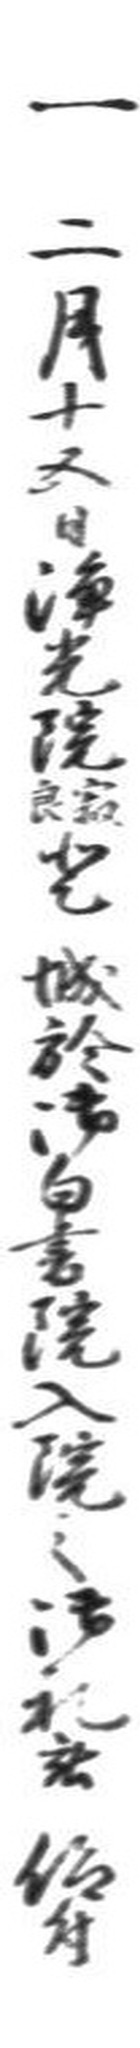一二月十五日浄光院寂良登城於御白書院入院之御礼被仰付
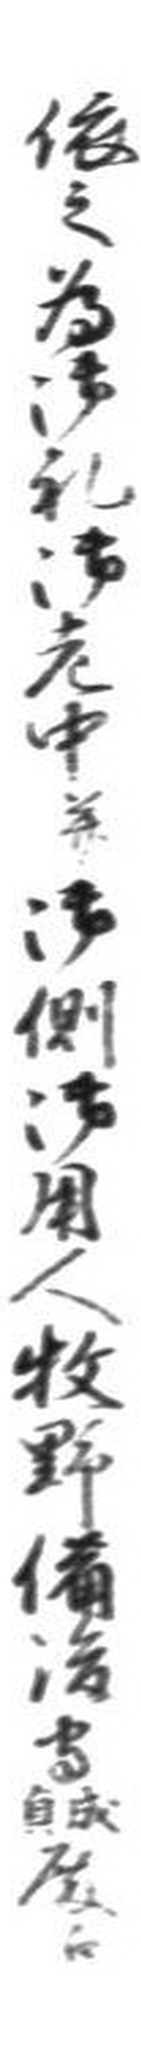依之為御礼御老中并御側御用人牧野備後守成貞殿江
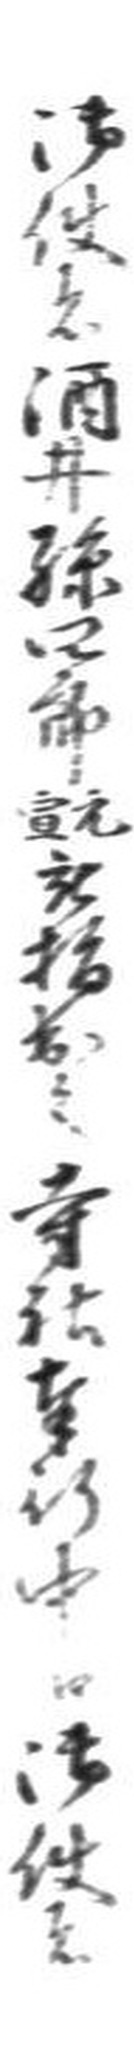御使者酒井孫四郎元宣被指出之寺社奉行中江御使者
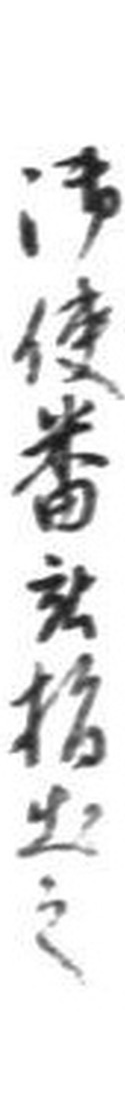御使番被指出之
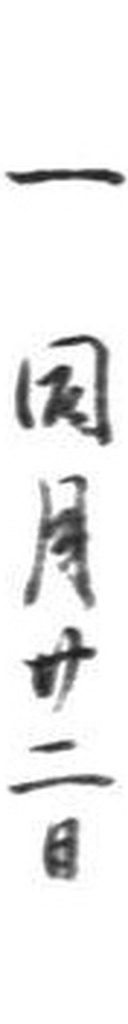一同月廿二日

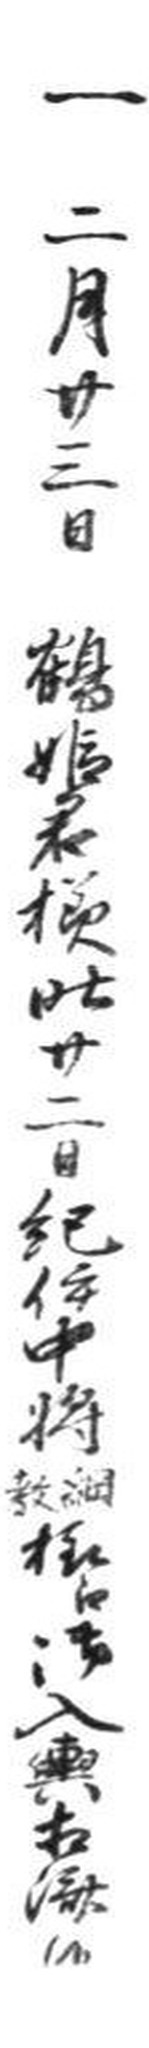一二月廿三日鶴姫君様昨廿二日紀伊中将綱教様江御入輿相済候
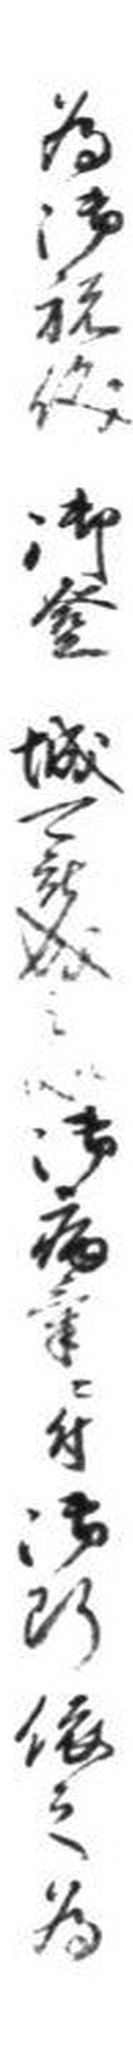為御祝儀御登城可被成之処御病気ニ付御断依之為
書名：家譜 十五 綱昌公 従天和元年到元禄十二年
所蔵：福井県文書館 Fukui Prefectural Archives
